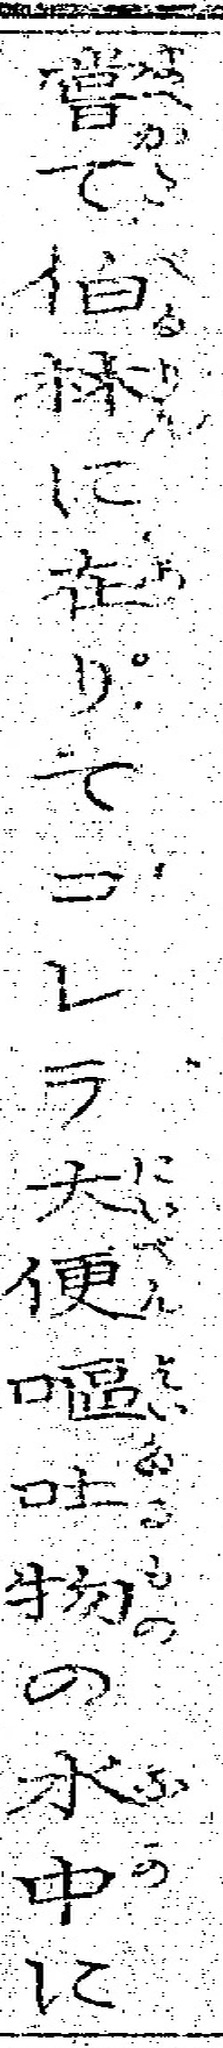嘗伯林に在りてコレラ大便嘔吐物の水中に
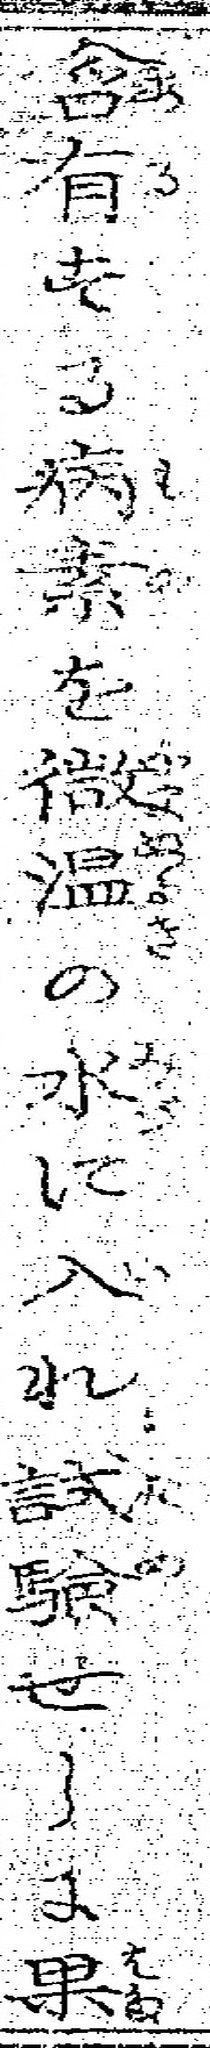含有する病素を微温の水に入れ試験せしに果
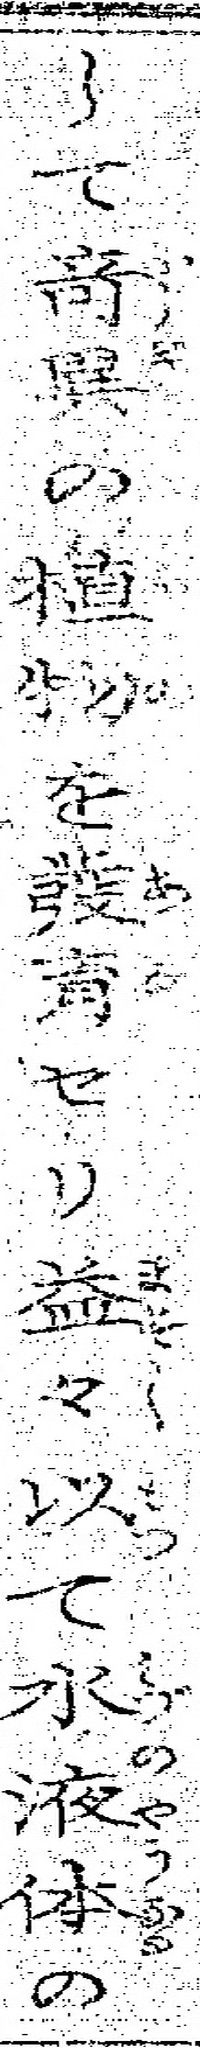して奇異の植物を発育せり益々以て水液体の
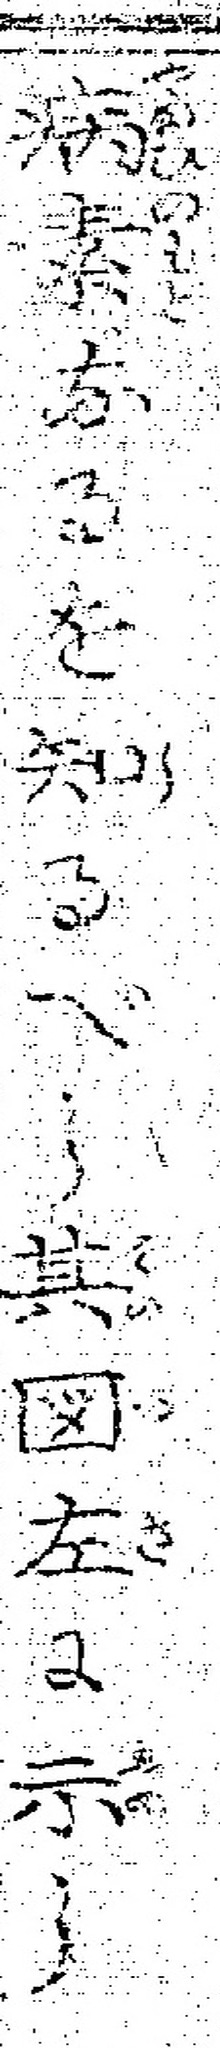病素なるを知るべき其図左に示し

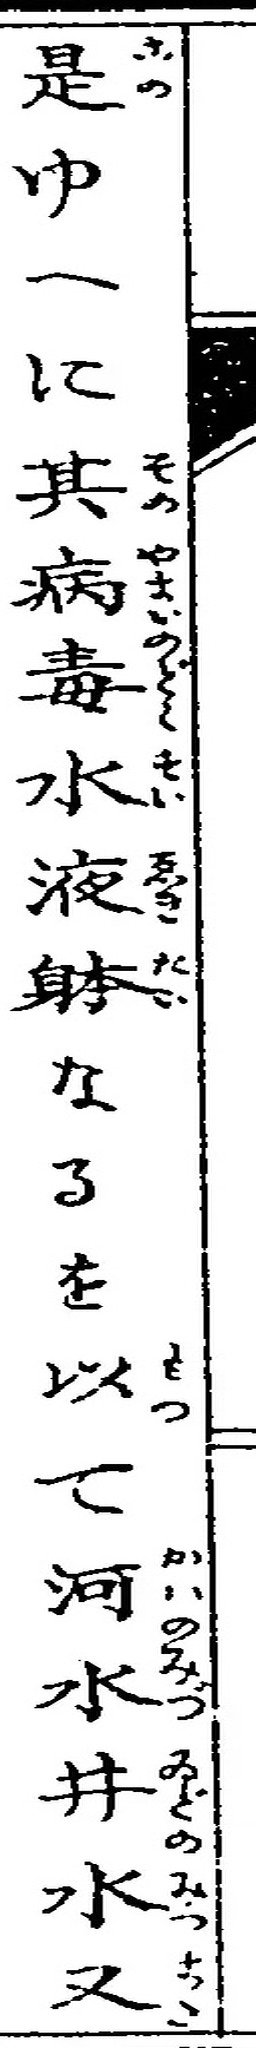是ゆへに其病毒水液躰なるを以て河水井水又
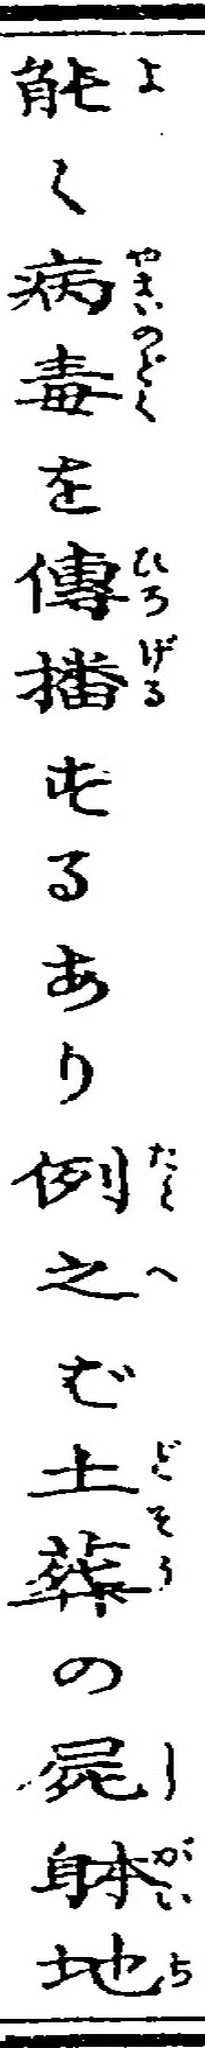能く病毒を伝播するあり例之は土葬の屍躰地
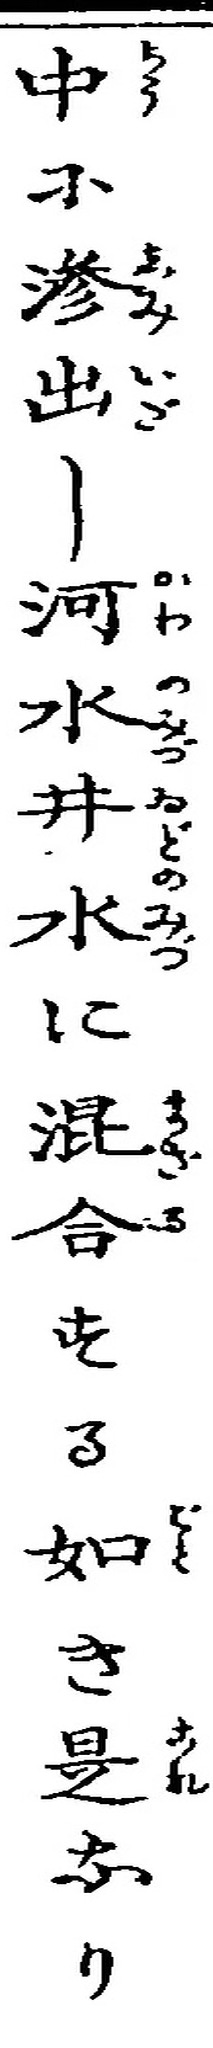中に滲出し河水井水に混合する如き是なり
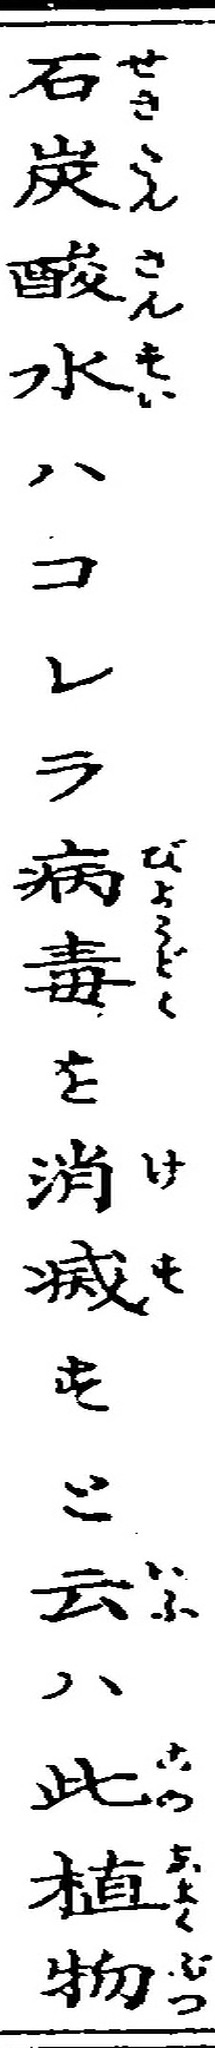石炭酸水はコレラ病毒を消滅すと云は此植物
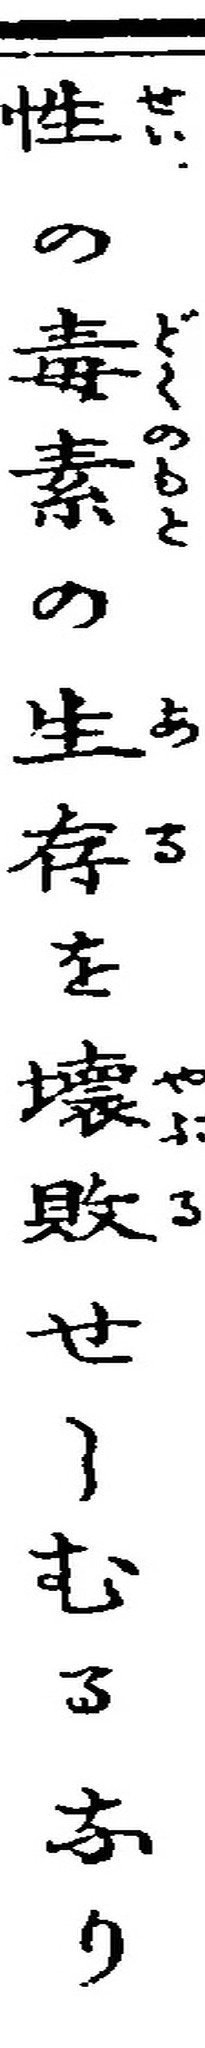性の毒素の生存を壊敗せしむるなり
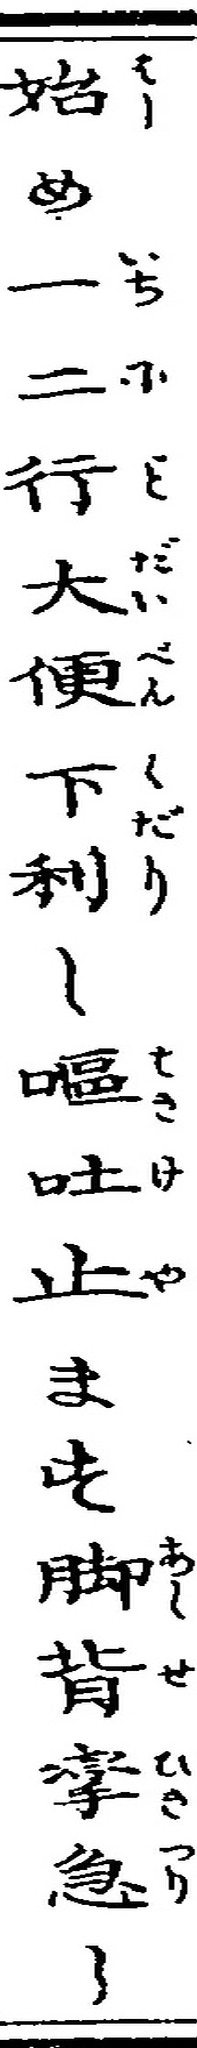始め一二行大便下利し嘔吐止ます脚背攣急し
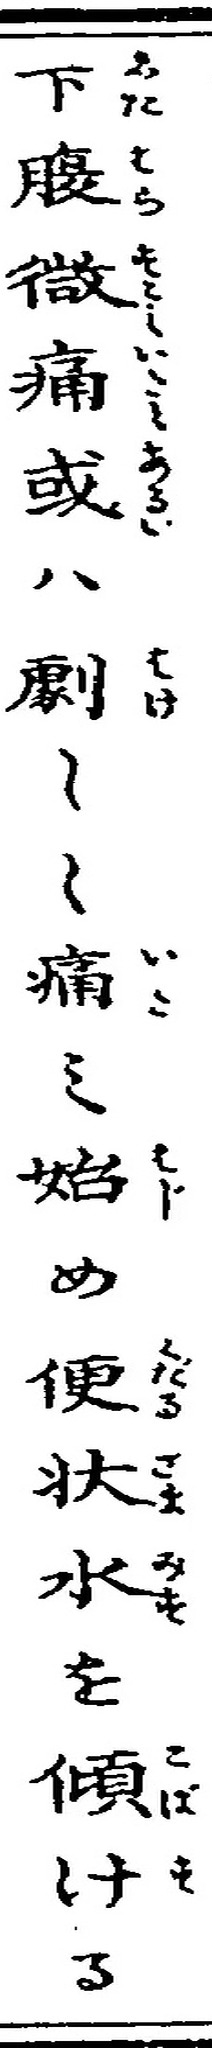下腹微痛或は劇しく痛み始め便状水を傾ける
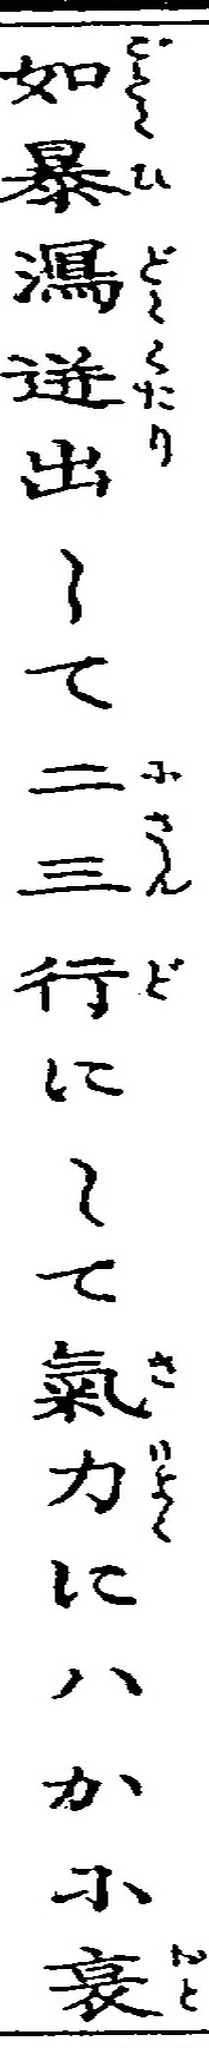如暴瀉迸出して二三行にして気力にはかに衰
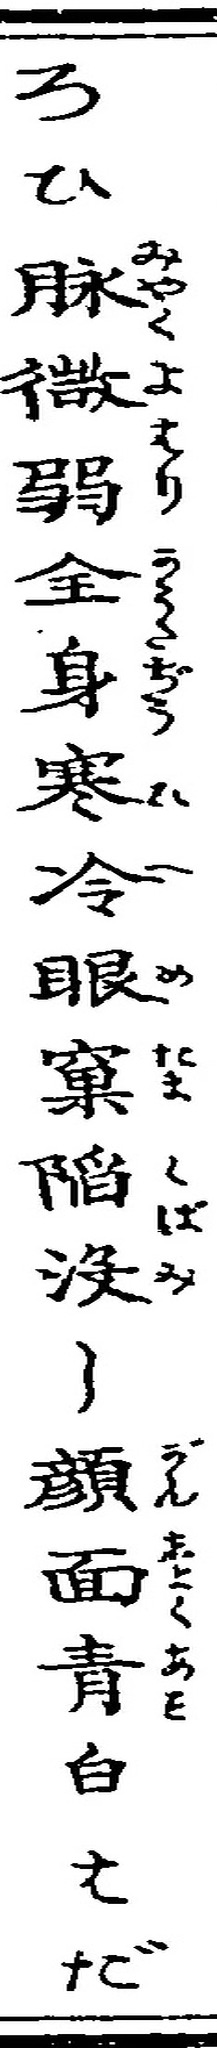ろひ脉微弱全身寒冷眼窩陥没し顔面青白はだ
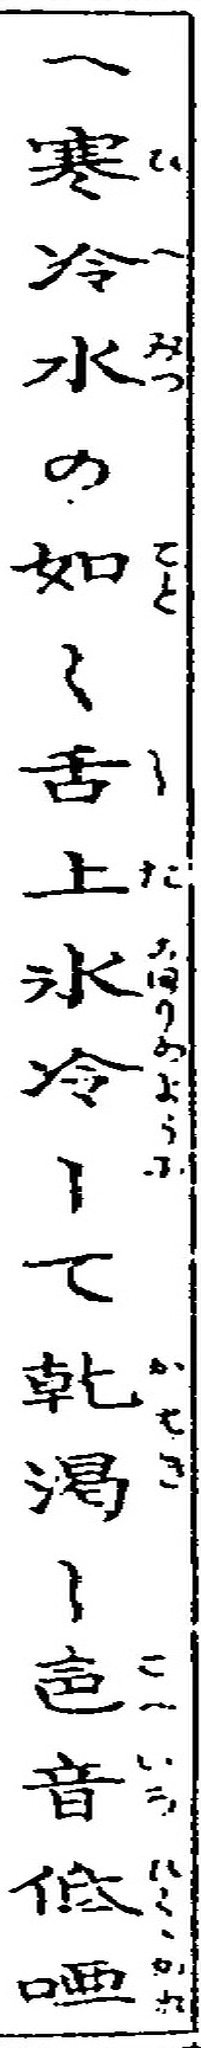へ寒冷水の如く舌上氷冷して乾渇し声色低嗄唖
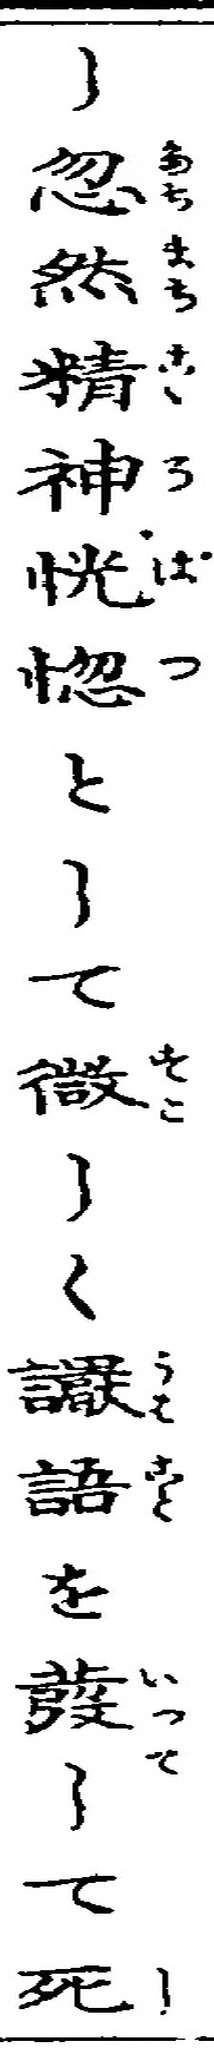し忽然精神恍惚として微しく譫語を発して死
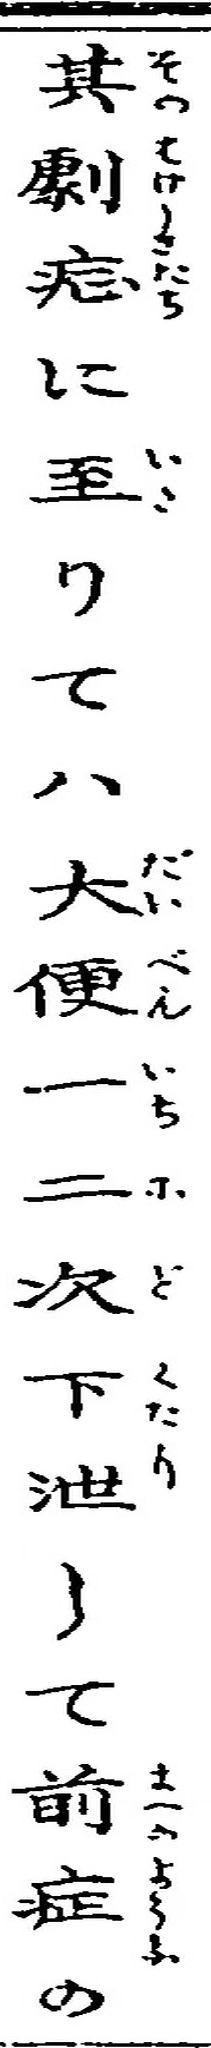其劇症に至りては大便一二次泄して前症の
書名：虎列剌予防民間の心得
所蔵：国立国会図書館 National Diet Library, JAPAN
